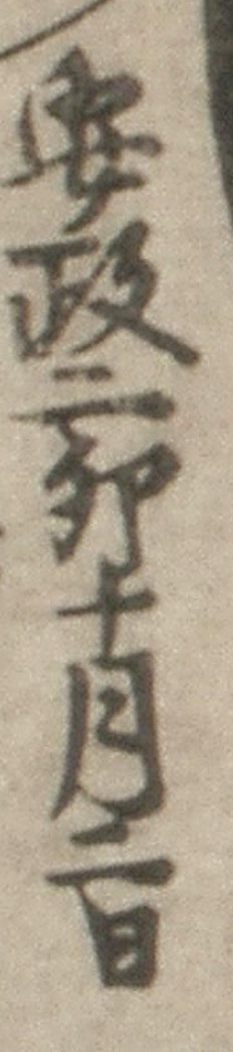安政二卯十月二日
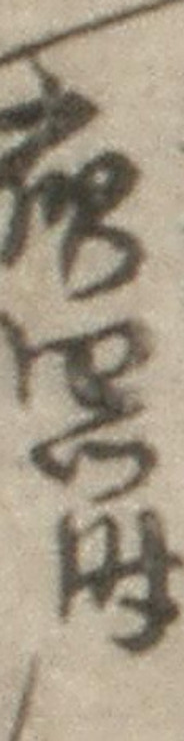夜四ツ時
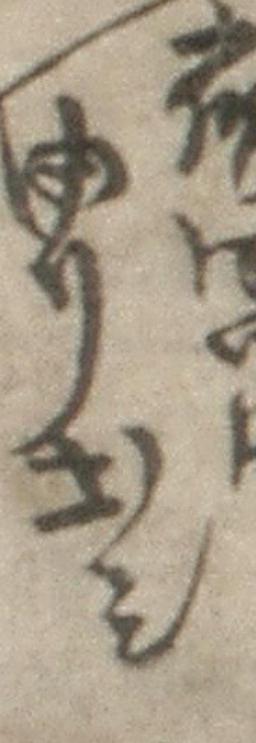ゆり出シ

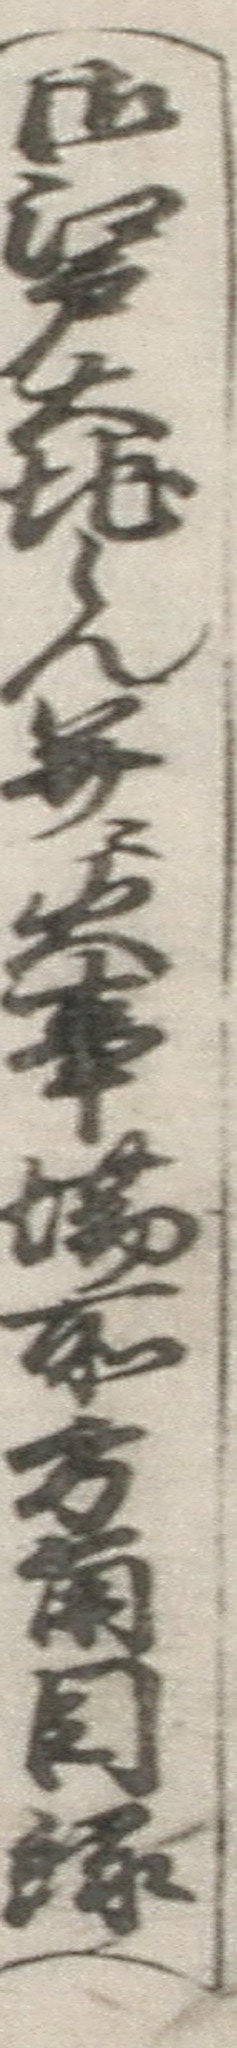御江戸大地しん並に火事場所方角目録
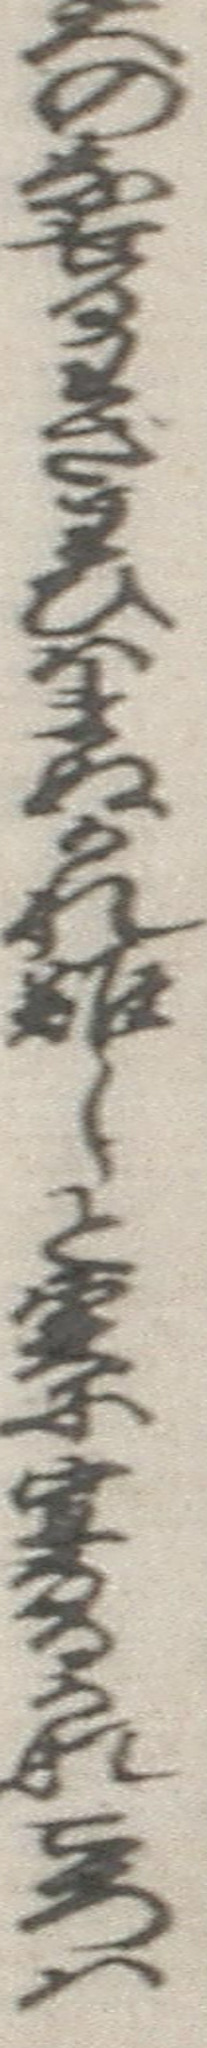天のなせるわざはひハまぬかれ難しと実に憂なかれころハ
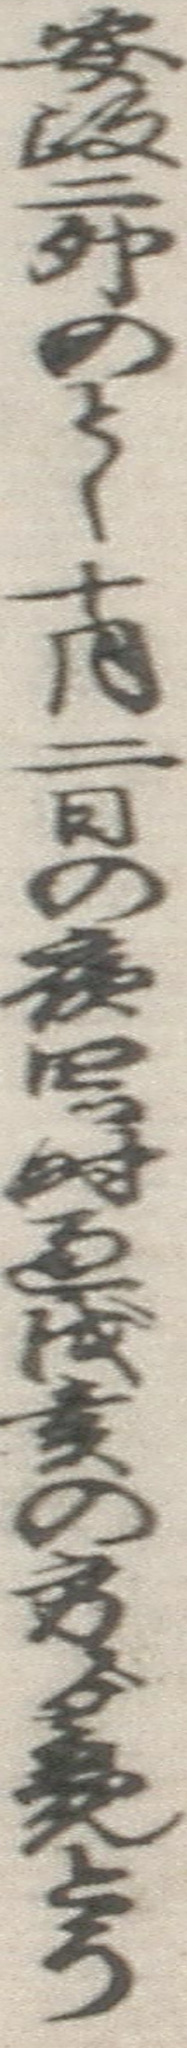安政二卯のとし十月二日の夜四ッ時過戌亥の方ゟしんとう
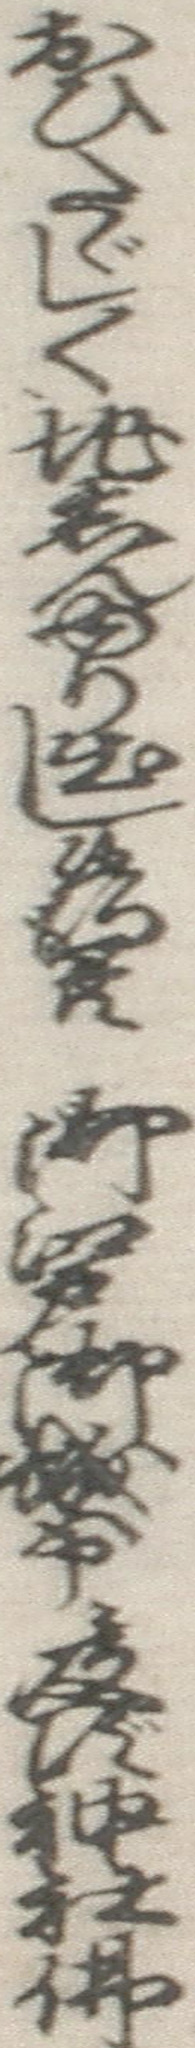おひたゞしく地しんゆり出し候得共江戸御城ハ申二及ハず神社仏
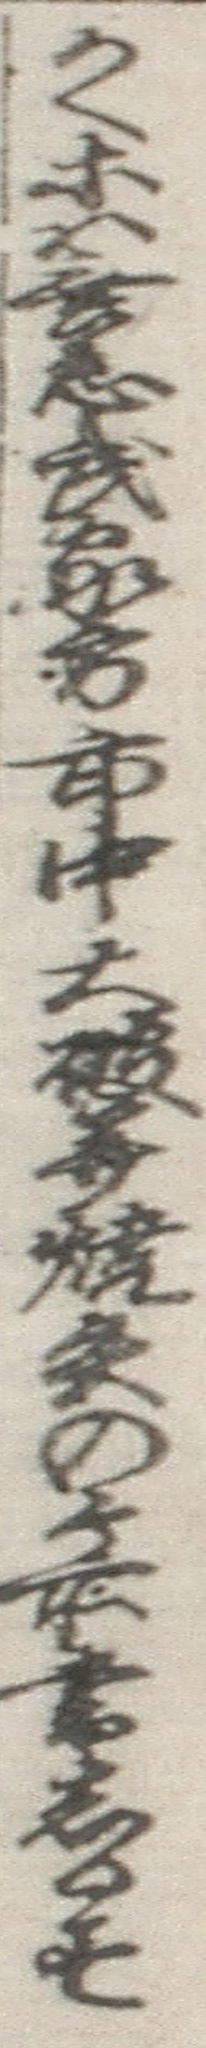かく等ハ無恙武家方市中大破并焼失のヶ所書しるす
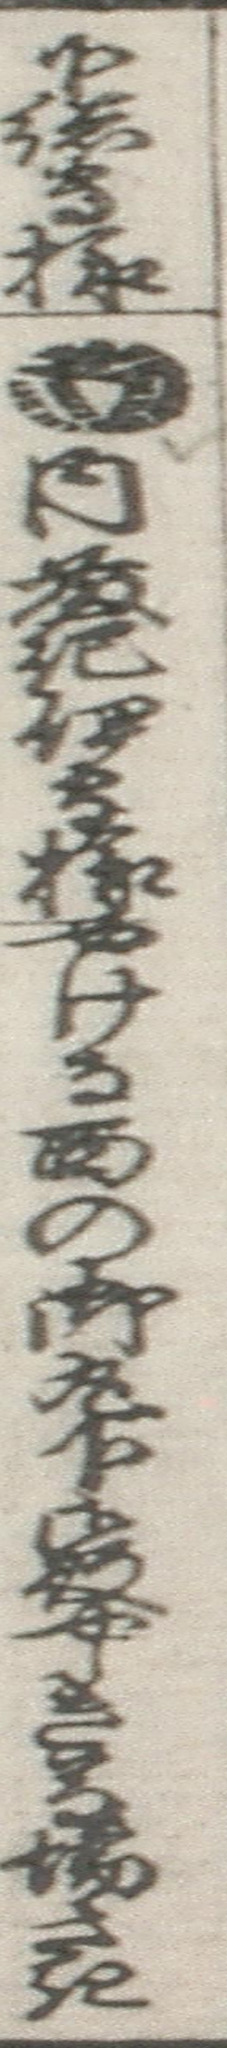下総守様内藤紀伊守様やける西の御丸下御役やしき馬場さき
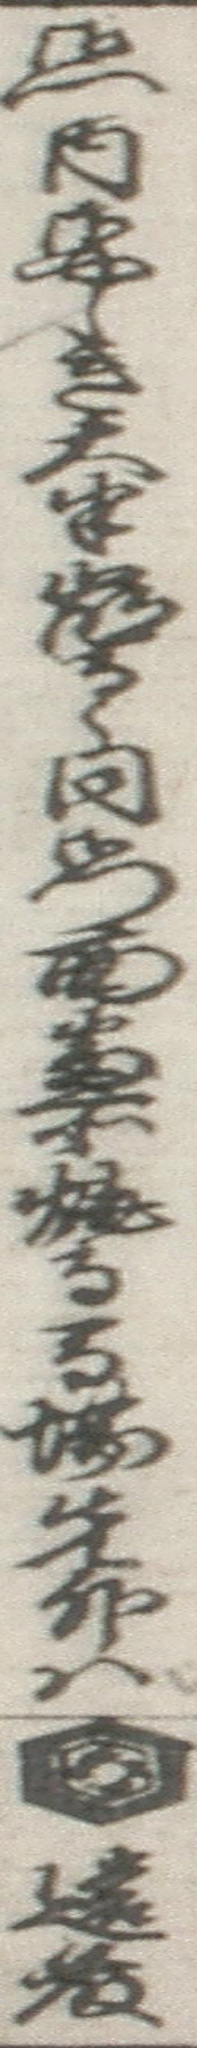御門内御やしき大半崩るゝ同御門西番所焼る馬場先外ハ遠藤
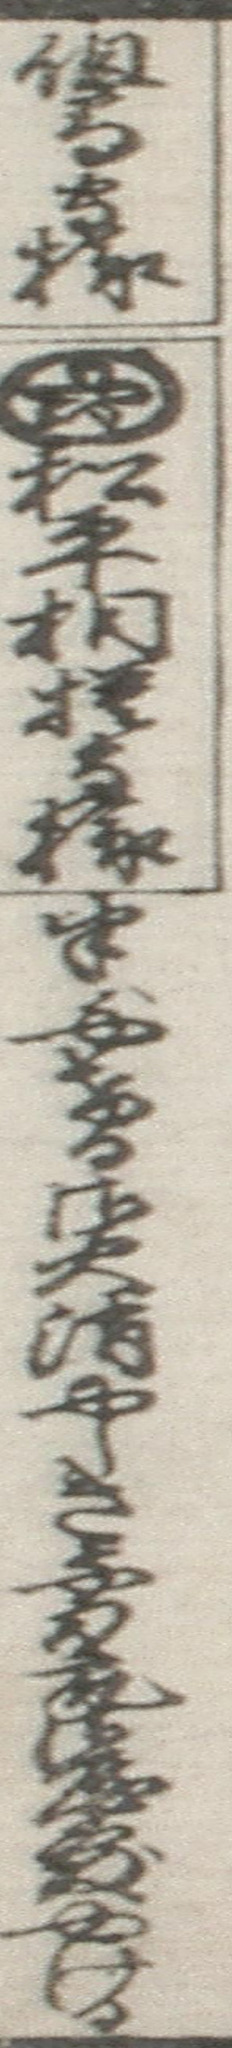但馬守様松平相模守様半やける御火消やしき与力衆御屋敷やける
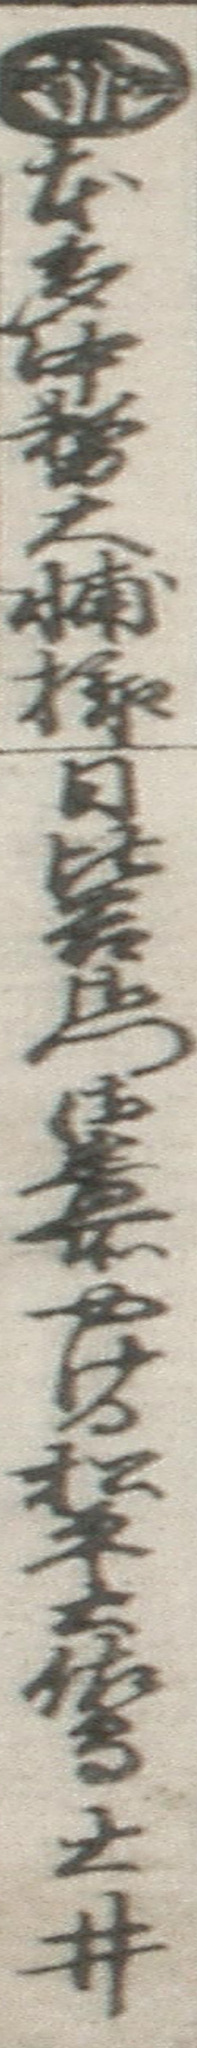本多中務大輔様日比谷御門御番所やける松平土佐守土井

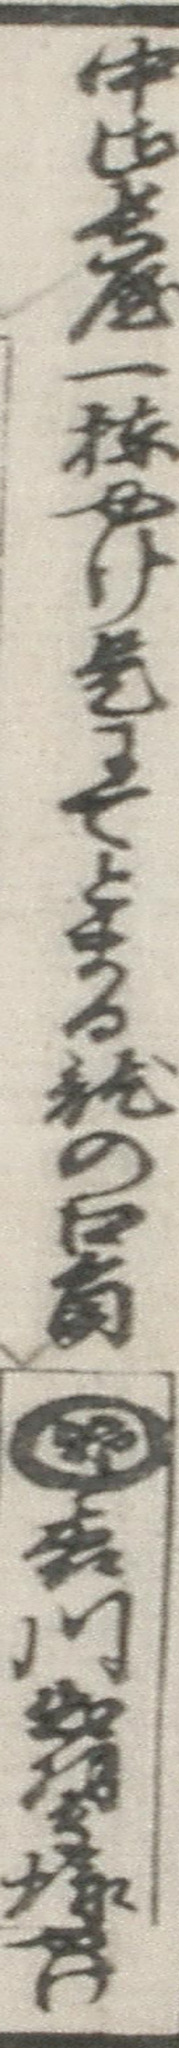中御長屋一棟やけ是にてとまる龍の口角森川出羽守様やけ
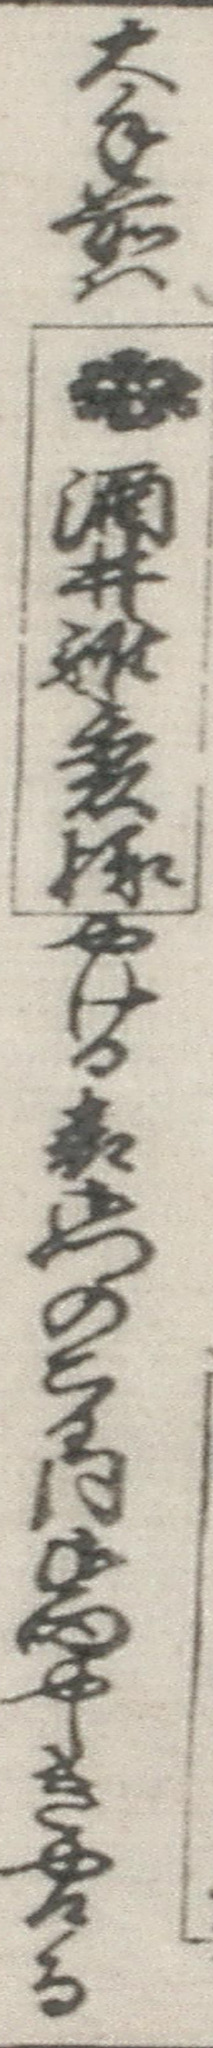大手前ハ酒井雅楽頭様やける表御門のこる同御向やしきやける
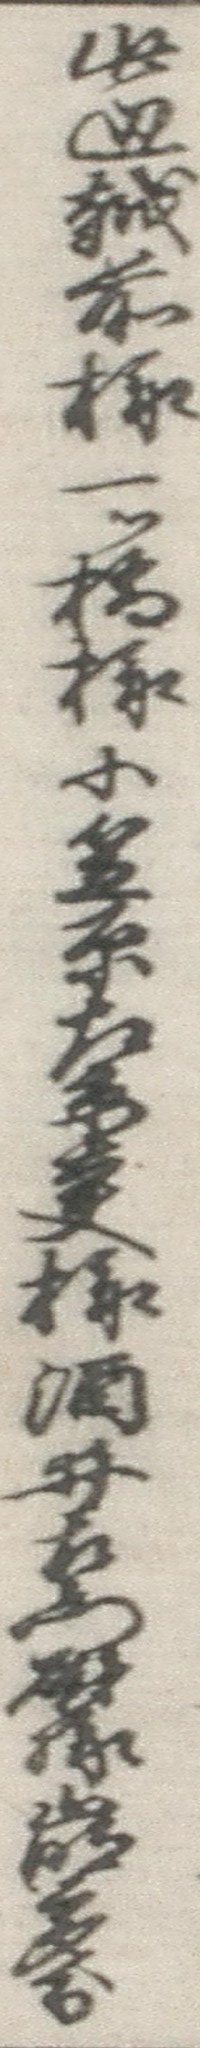此辺越前様一ツ橋様小笠原左京太夫様酒井左衛門尉様崩多分
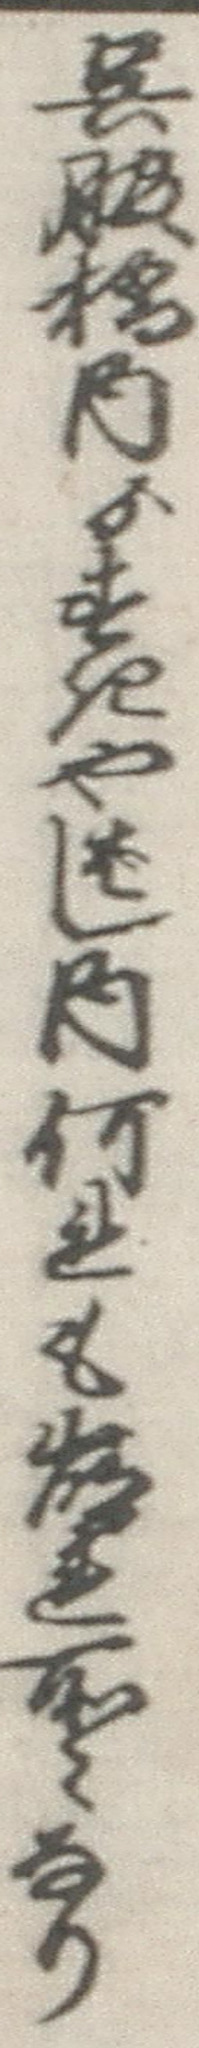呉服橋門ゟすきやばし内何れも崩れ所々なり
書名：大地震焼場細見記
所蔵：東京大学地震研究所図書室 Earthquake Research Institute Library, The University of Tokyo, JAPAN
